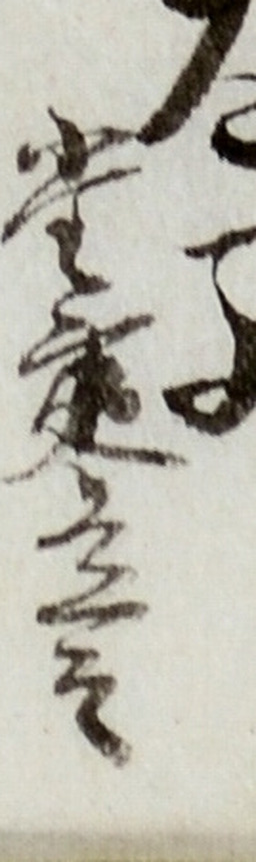堂建有之
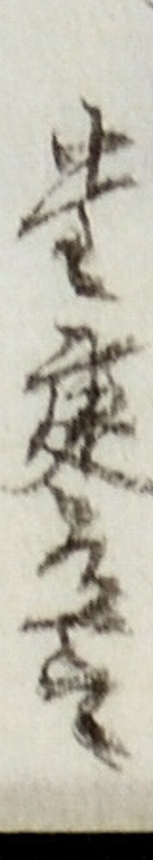堂建有之
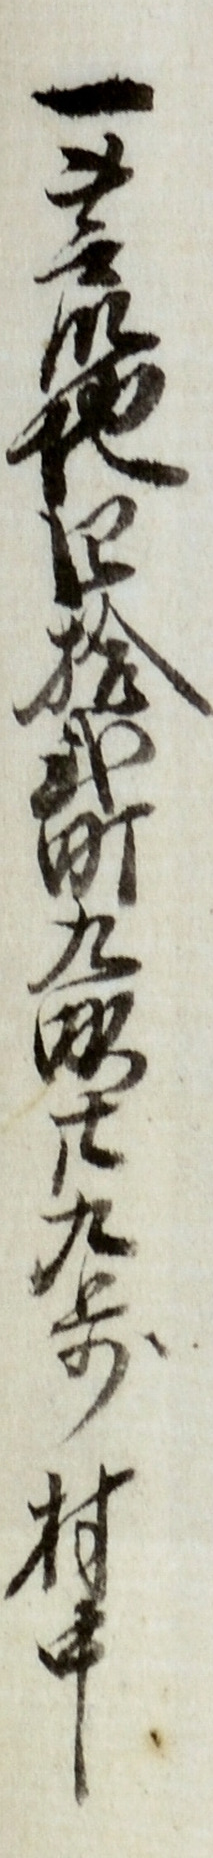一荒地四拾弐町九畝廿九歩村中
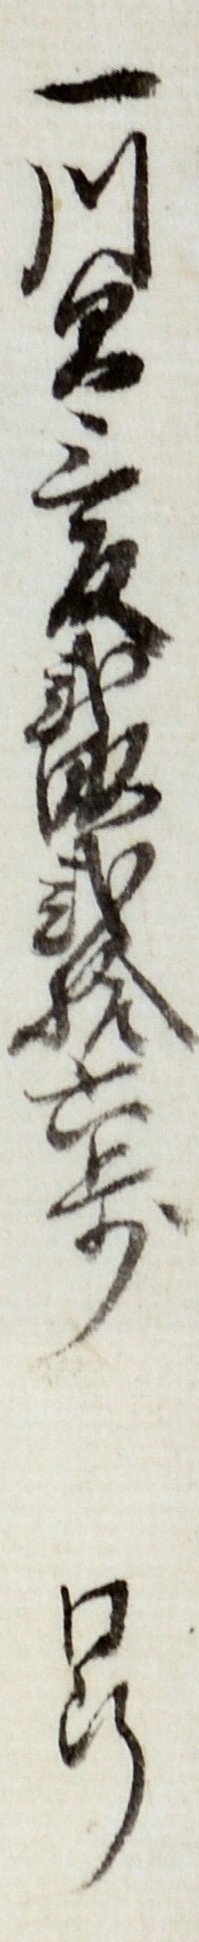一川欠三反弐畝弐拾六歩同断
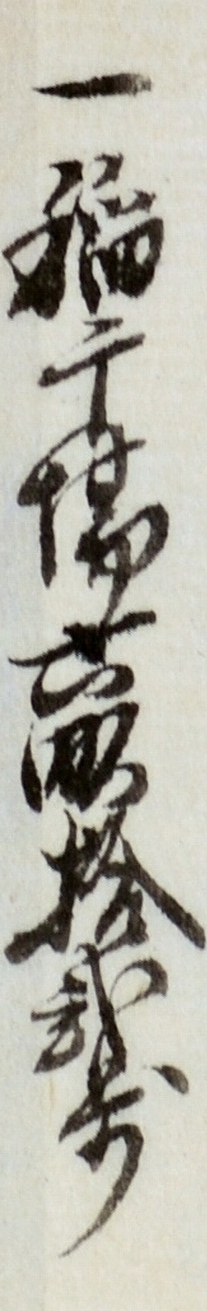一稲干場六畝拾弐歩

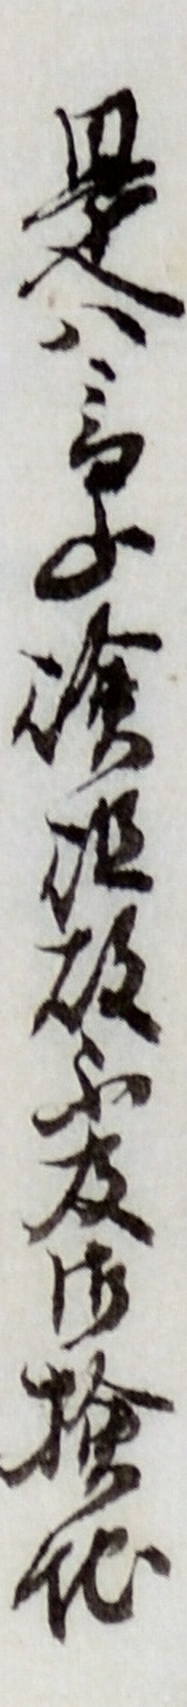是ハ高山嶮岨故不及御検地
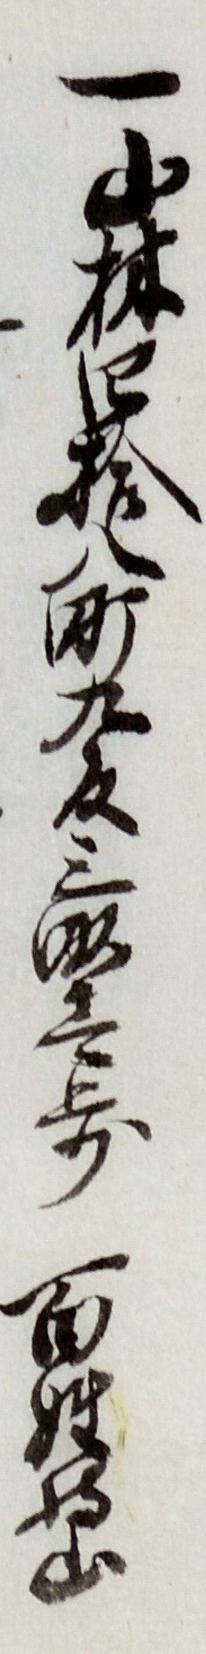一山林四拾八町九反三畝壱歩百姓持山
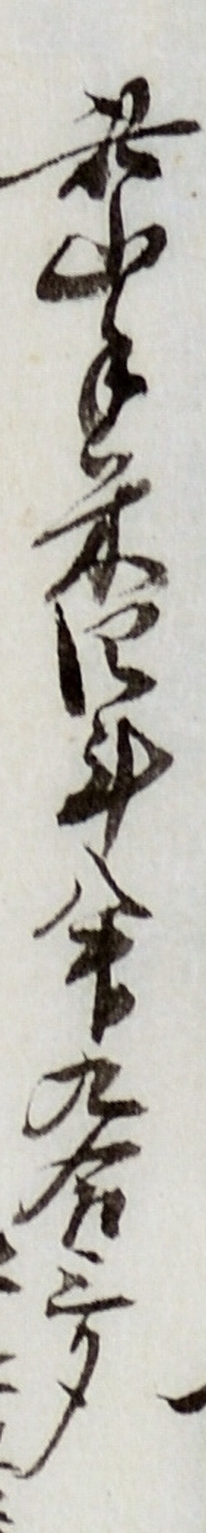此山手米四斗八升九合三勺
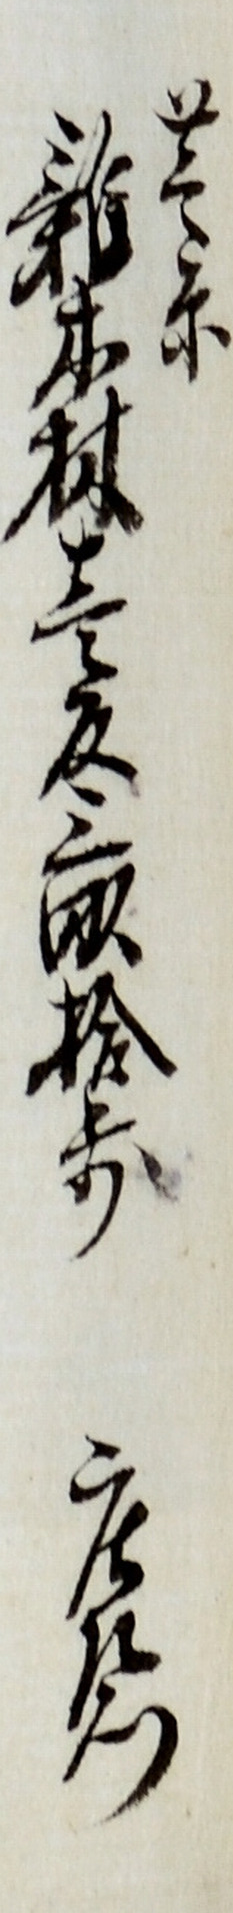雑木林壱反三畝拾歩庄左衛門
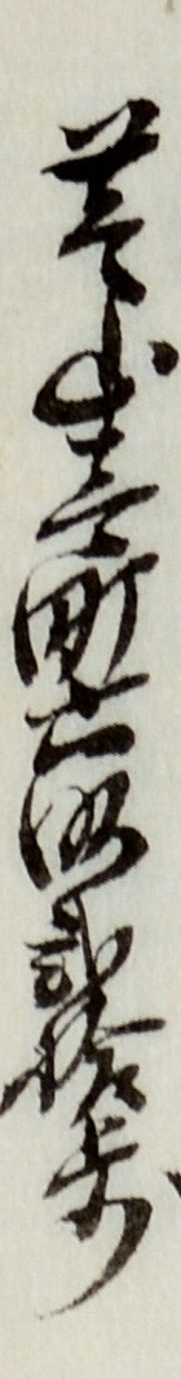芝山壱町六畝弐拾歩村中

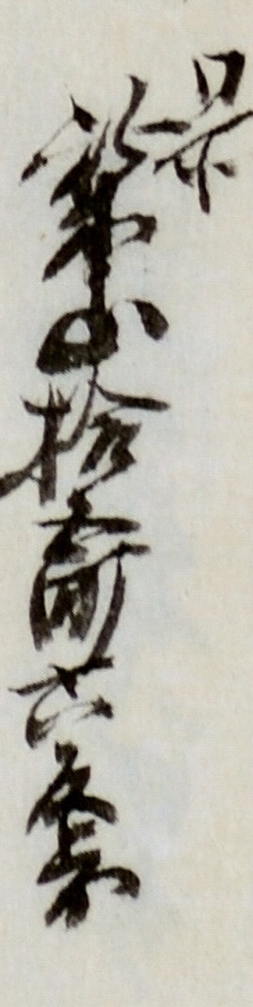柴山拾五町六反歩村中
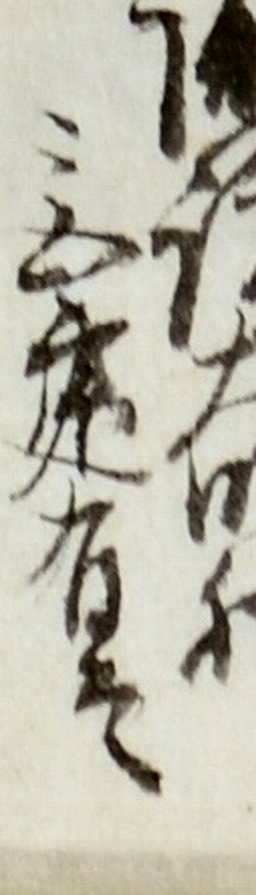宮建有之
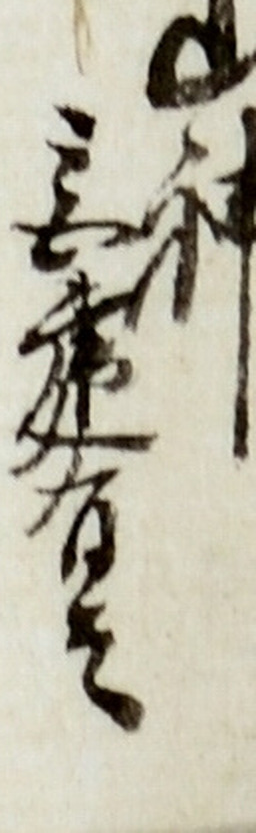宮建有之
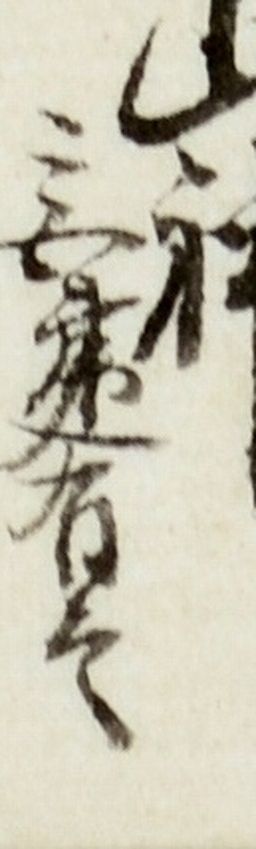宮建有之
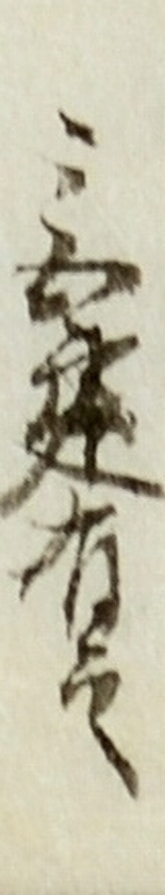宮建有之
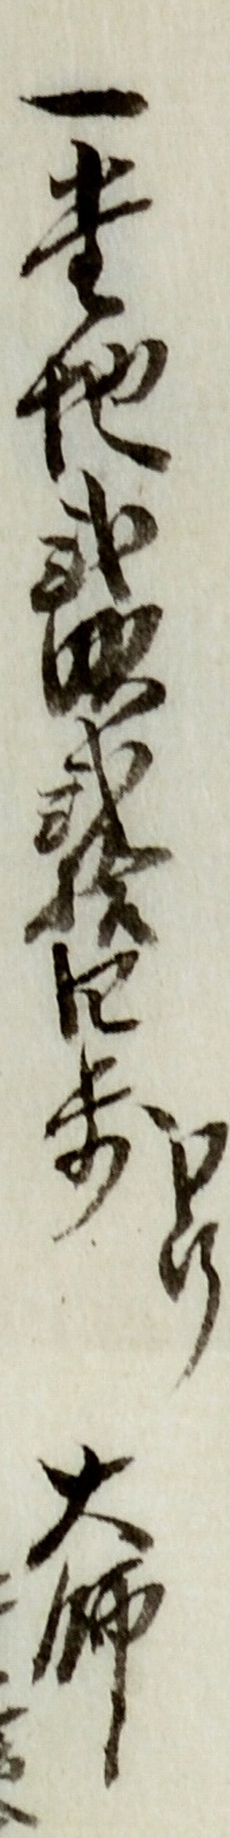一堂地弐畝弐拾四歩大師
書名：御領分中山林社地手控
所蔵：伊那市立高遠町図書館・合同会社AMANE
